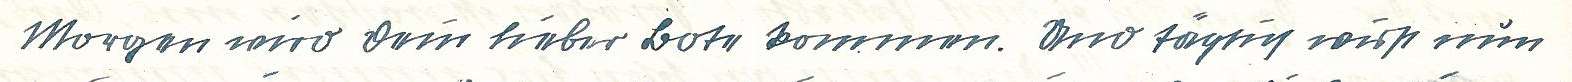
Morgen wird Dein lieber Bote kommen. Und täglich wirst nun
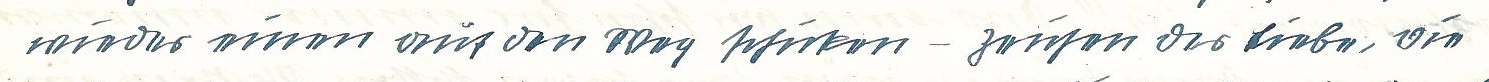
wieder einen auf den Weg schicken – Zeugen der Liebe, die
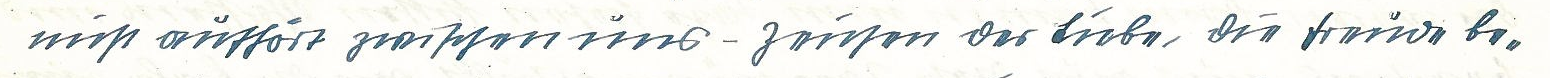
nicht aufhört zwischen uns – Zeugen der Liebe, die Freude be¬
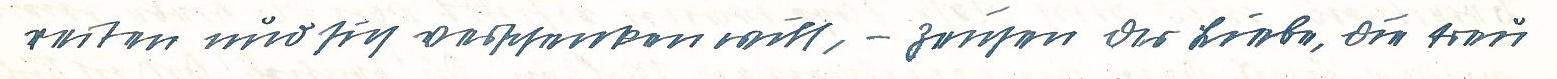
reiten und sich verschenken will, – Zeugen der Liebe, die treu
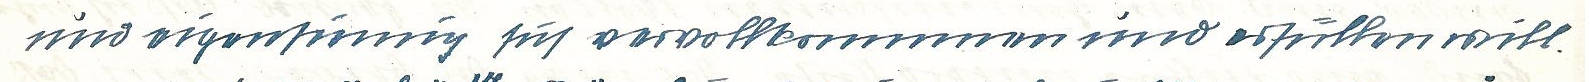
und eigensinnig sich vervollkommnen und erfüllen will.
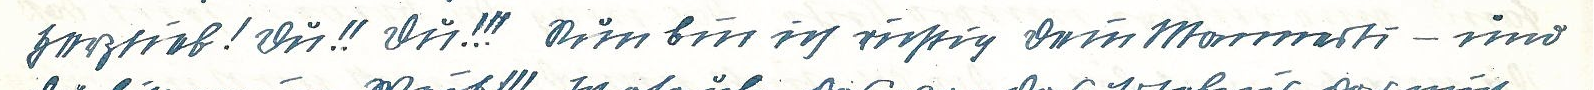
Herzlieb! Du!! Du!!! Nun bin ich richtig Dein Mannerli – und
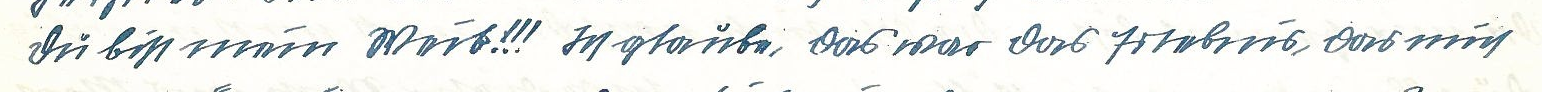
Du bist mein Weib!!! Ich glaube, das war das Erlebnis, das mich
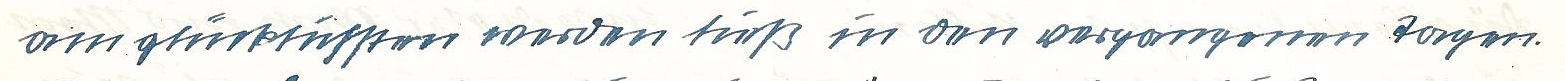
am glücklichsten werden ließ in den vergangenen Tagen.
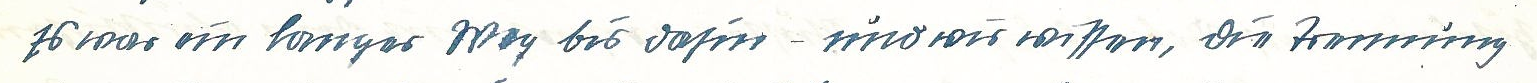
Es war ein langer Weg bis dahin – und wir wissen, die Trennung
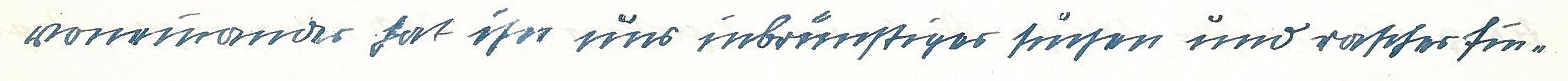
voneinander hat ihn uns inbrünstiger suchen und rascher fin¬
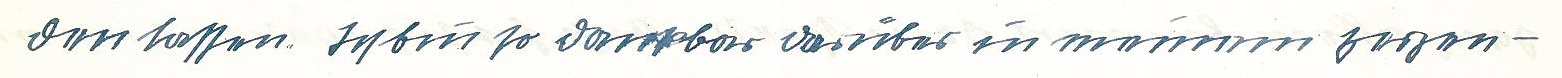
den lassen. Ich bin so dankbar darüber in meinem Herzen –
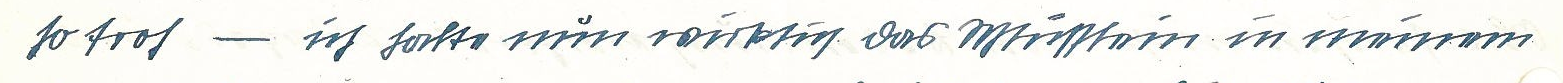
so froh – ich halte nun wirklich das Schlüsslein in meinem
